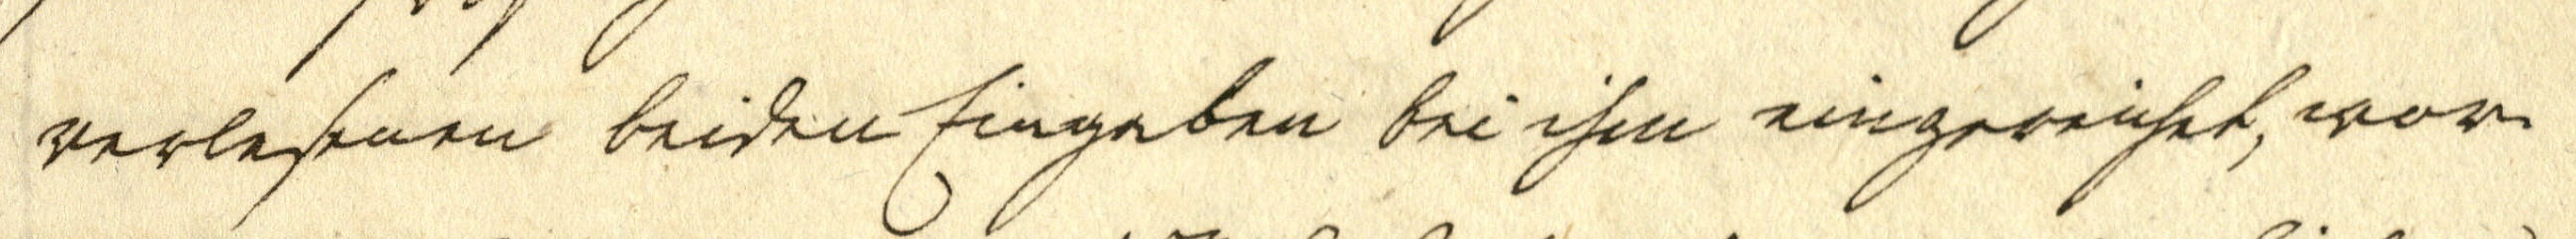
verlesenen beiden Eingaben bei ihm eingereichet, wor¬
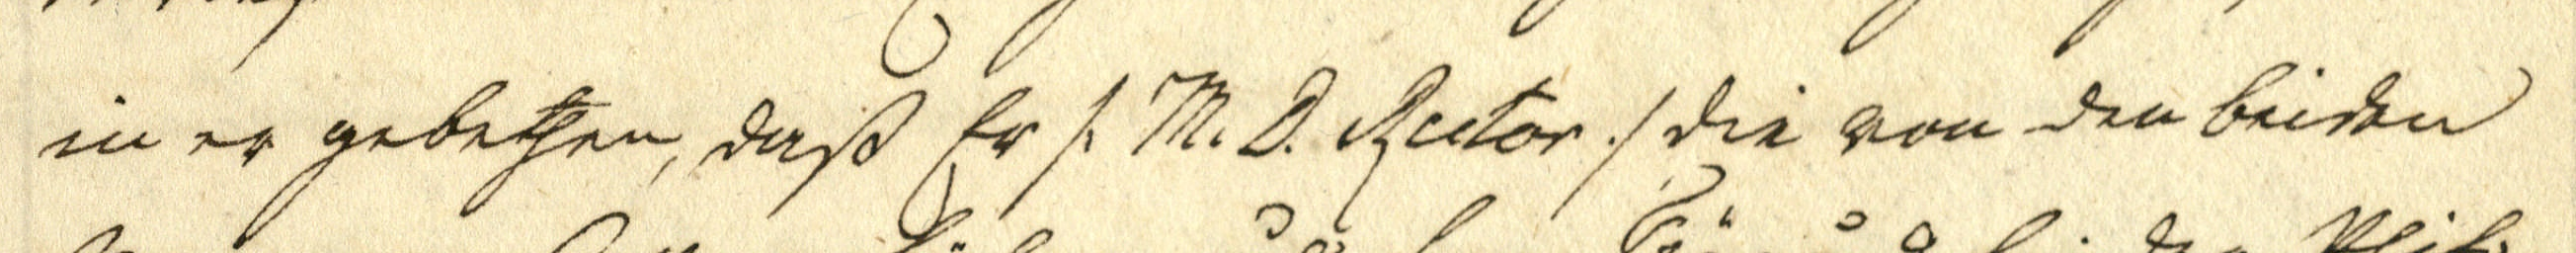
in er gebethen, daß Er / M. D. Rector / die von den beiden
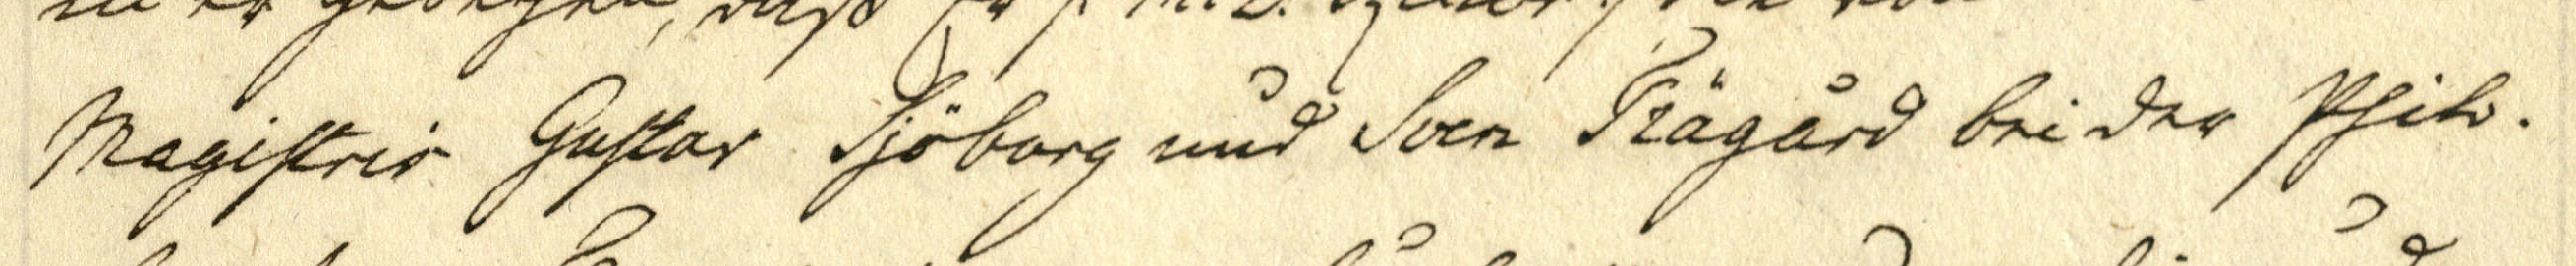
Magistris Gustav Sjöborg und Sven Trägård bei der Philo¬
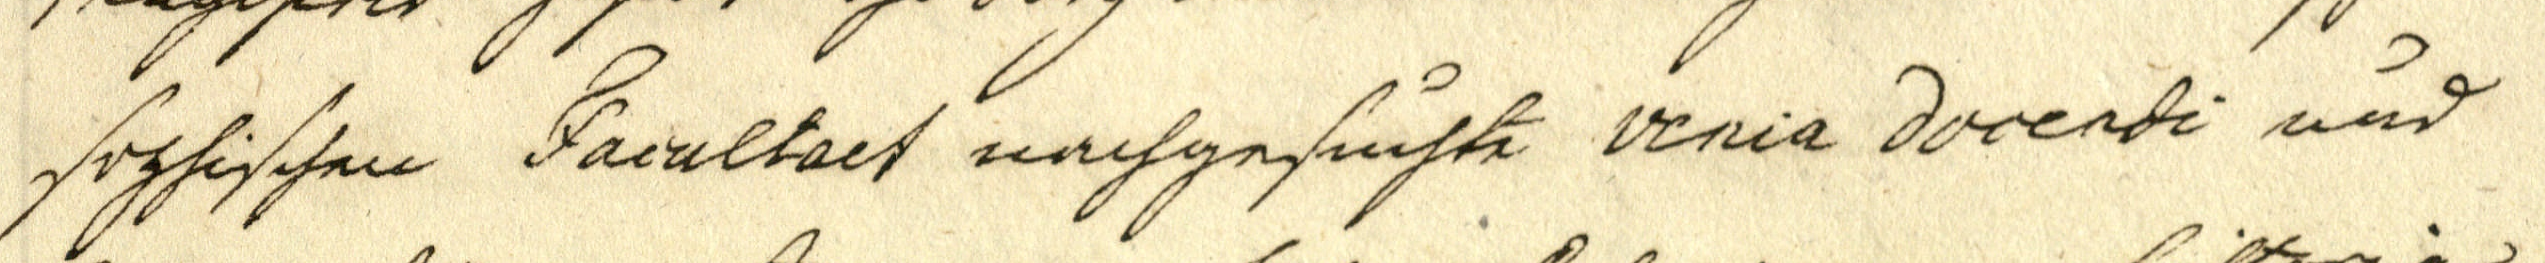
sophischen Facultät nachgesuchte venia docendi und
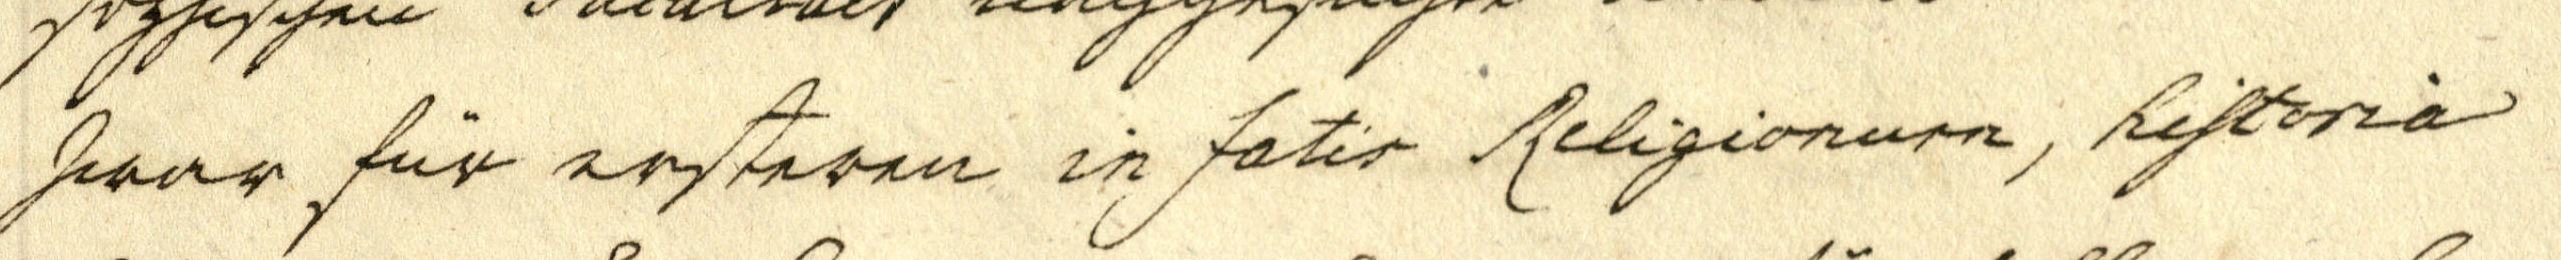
zwar für ersteren in fatis Religionum, historia
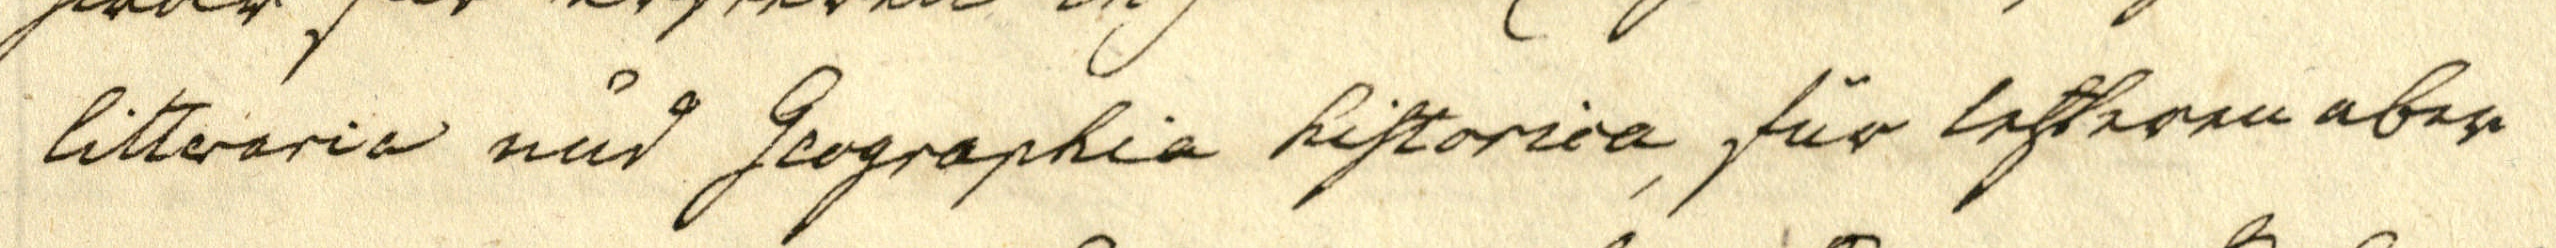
litteraria und Geographia historica, für letzteren aber
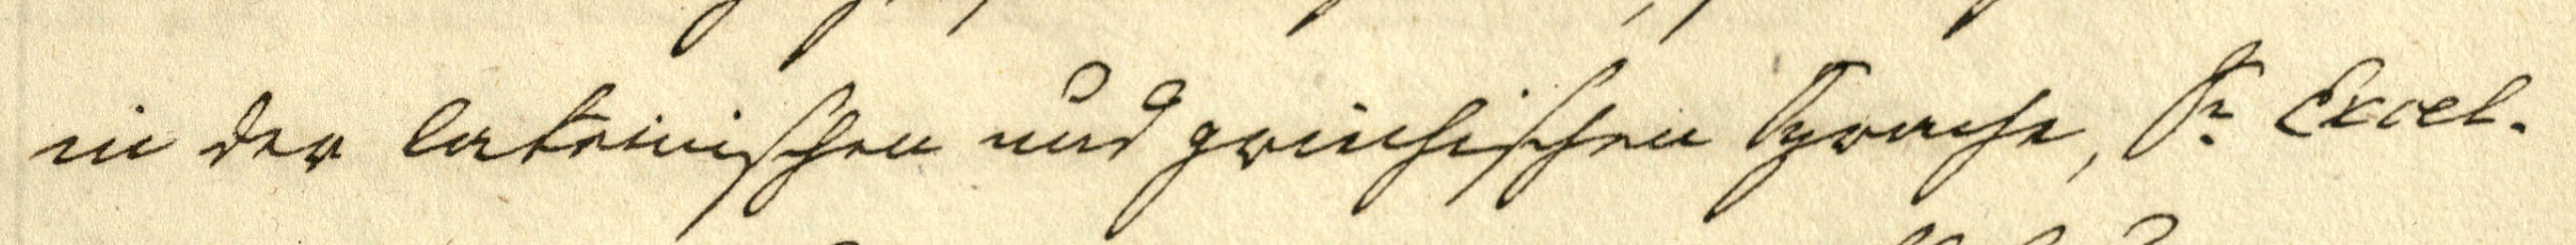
in der lateinischen und griechischen Sprache, Sr. Excel¬
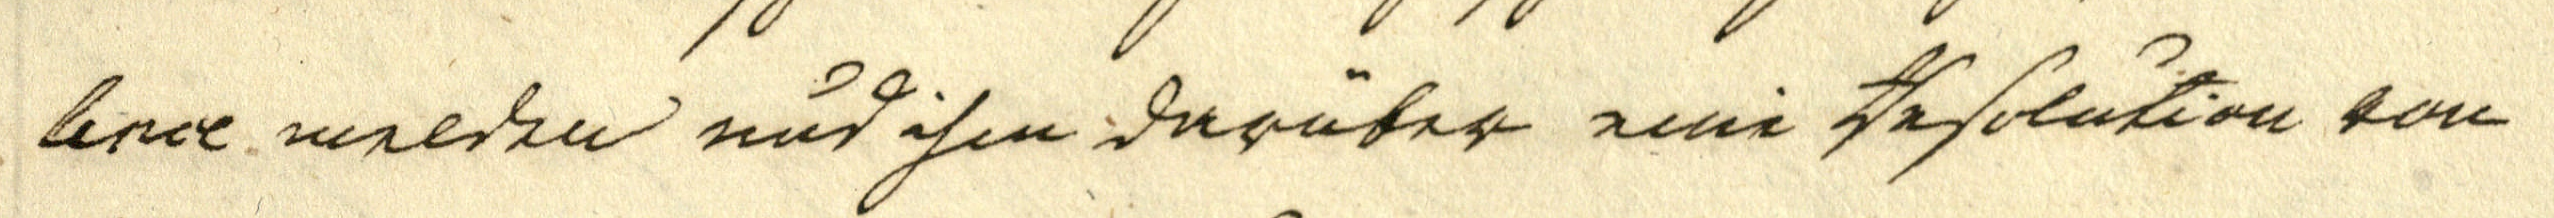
lence melden und ihm darüber eine Resolution von
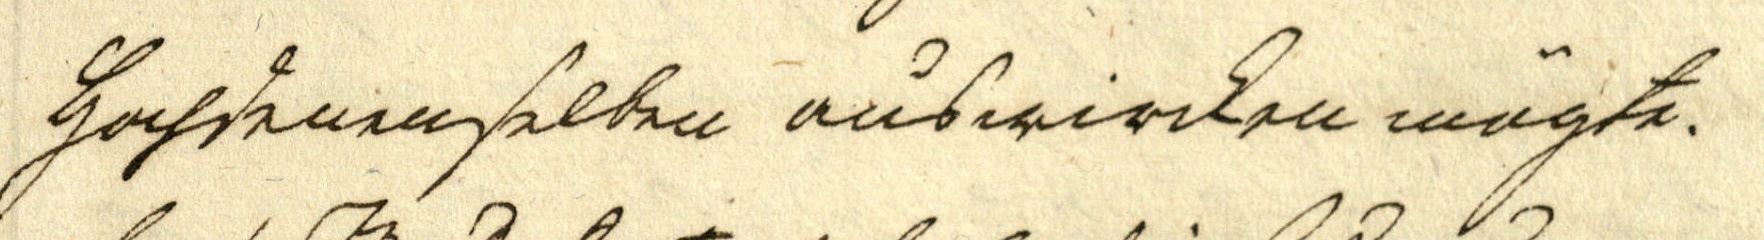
Hochdemselben auswircken mögte.
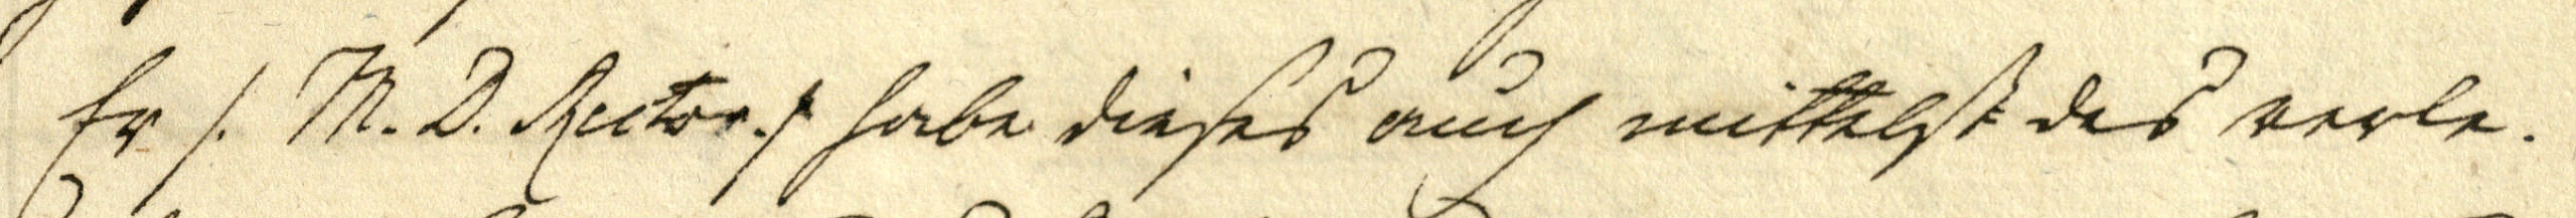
Er / M. D. Rector / habe dieses auch mittelst des verle¬
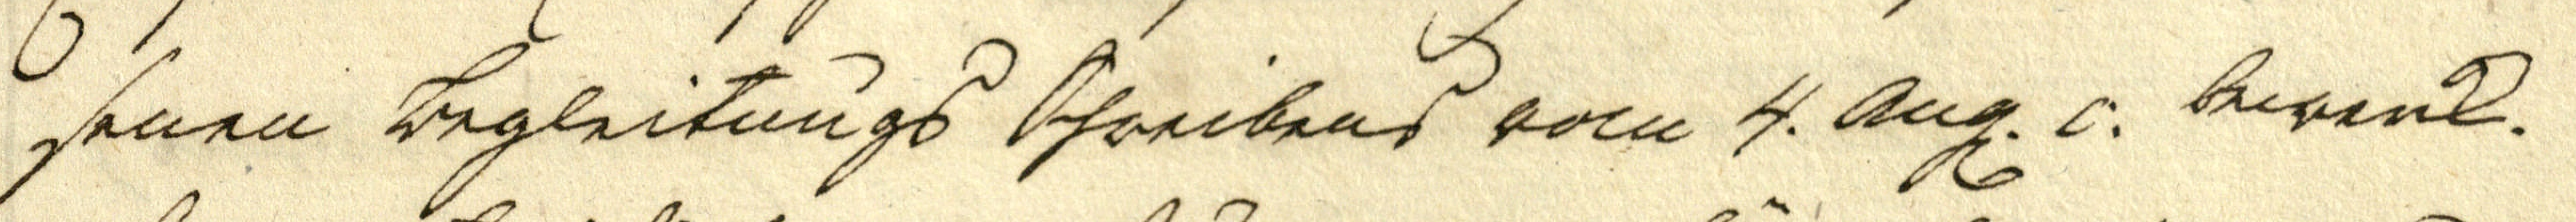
senen Begleitungs Schreibens vom 4. Aug. c. bewerk¬
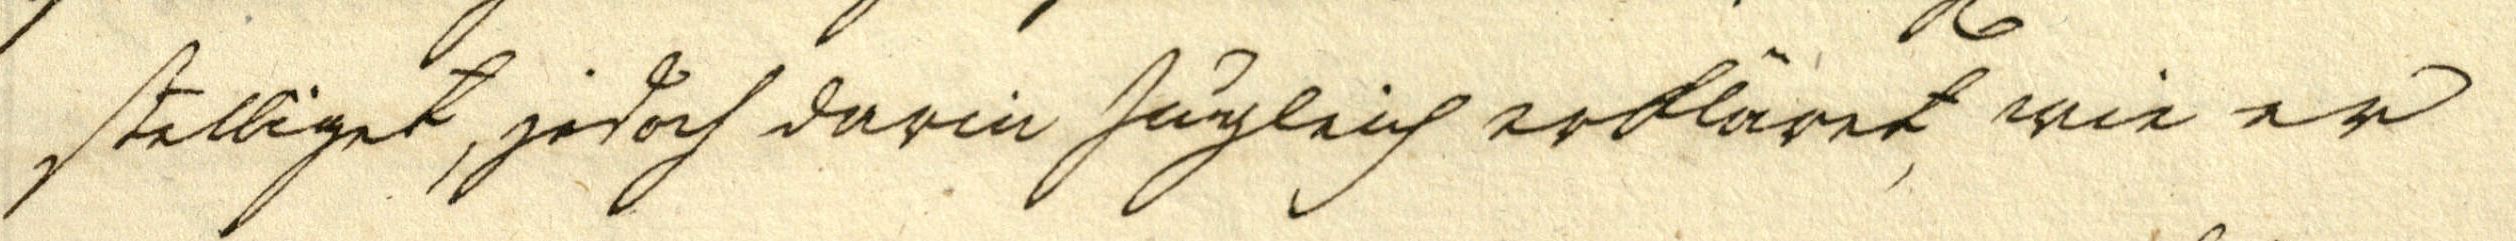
stelliget, jedoch darin zugleich erkläret, wie er
